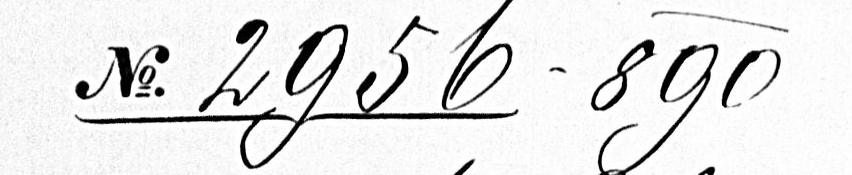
Nr. 2956-890
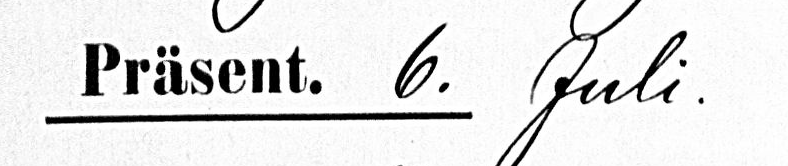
Präsent. 6. Juli.
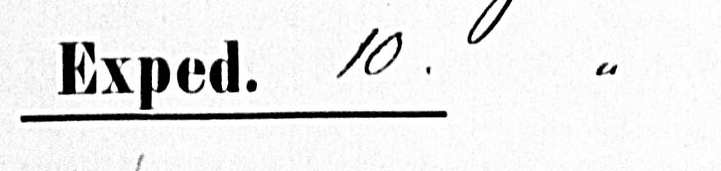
Exped. 10. Juli.
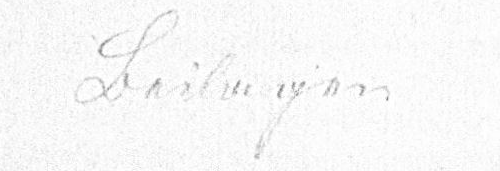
Beilagen
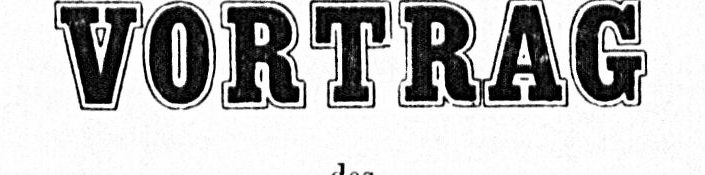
VORTRAG
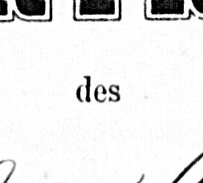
des
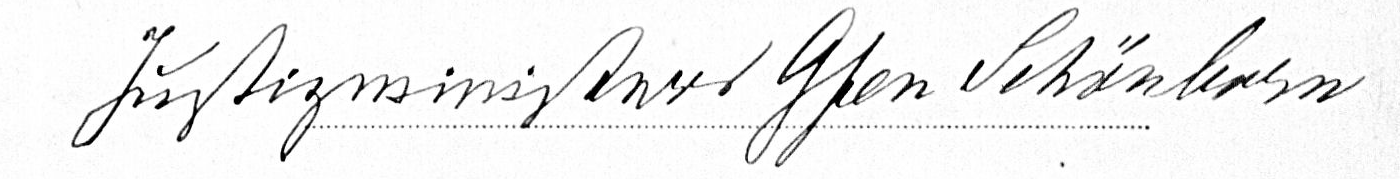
Justizministers Gxx Schönborn
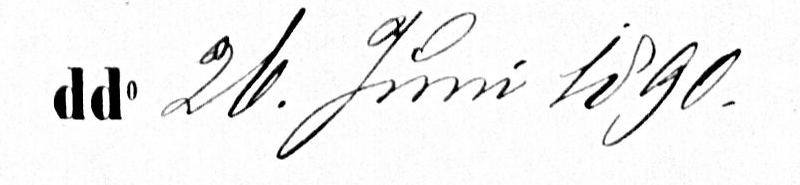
dd° 26. Juni 1890.
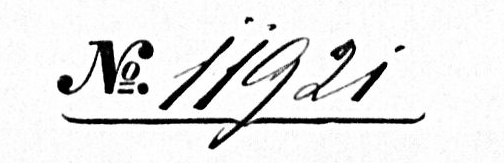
Nr. 11921
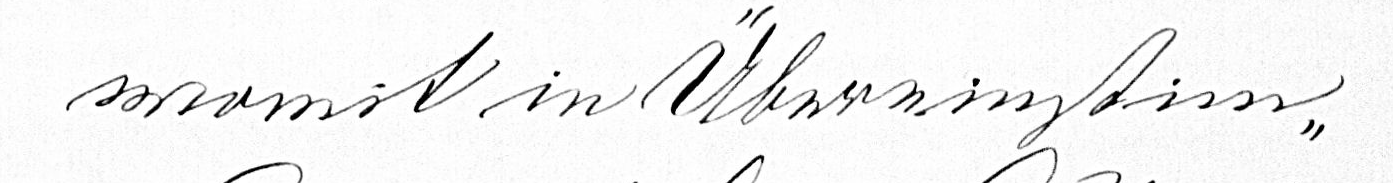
womit in Übereinstim¬
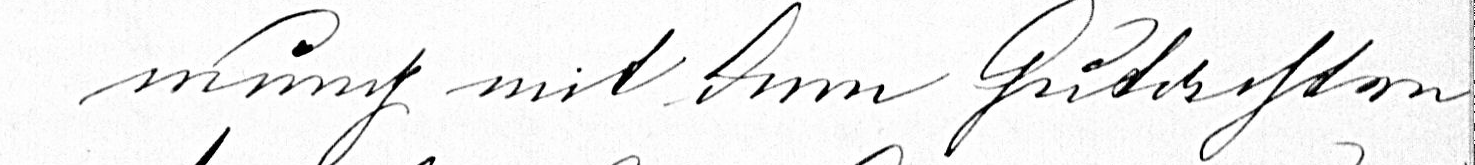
mung mit dem Gutachten
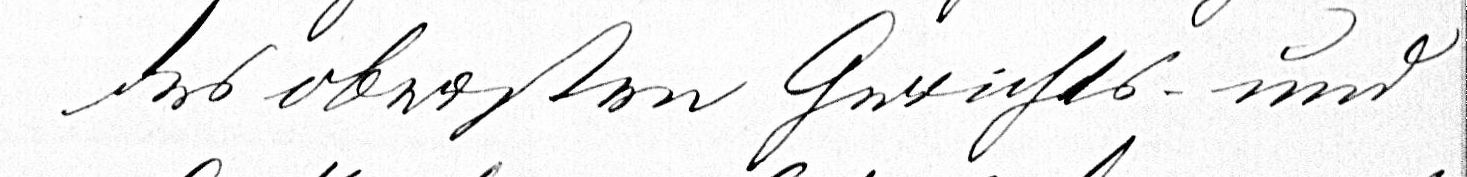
des obersten Gerichts- und
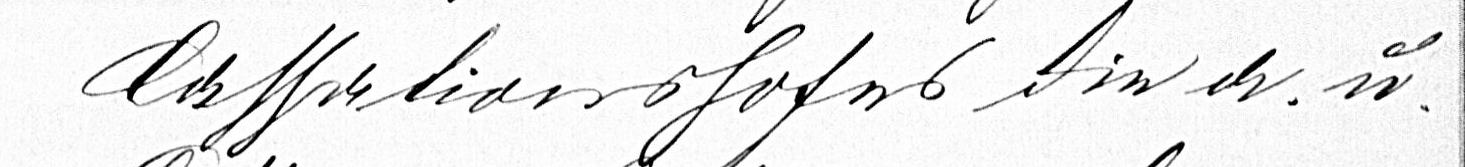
Cassationshofes die a. u.
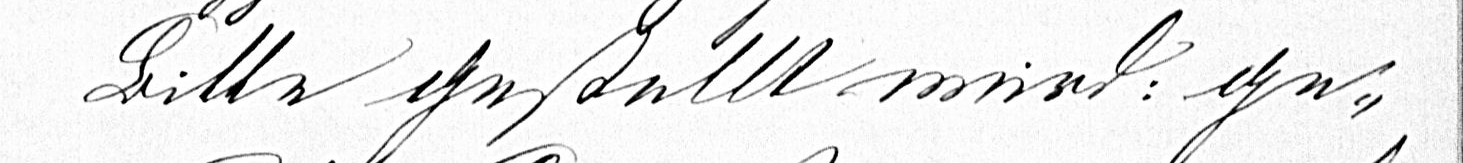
Bitte gestellt wird: ge¬
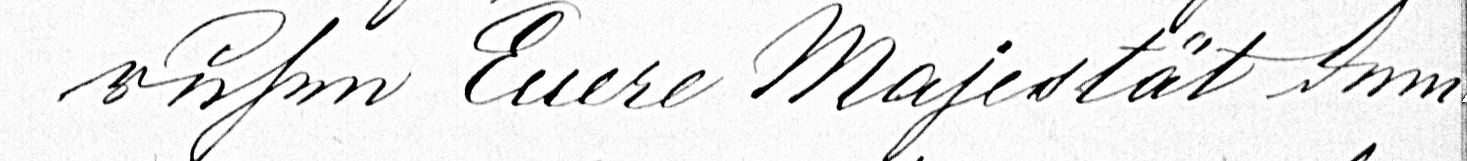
ruhen Euere Majestät dem
